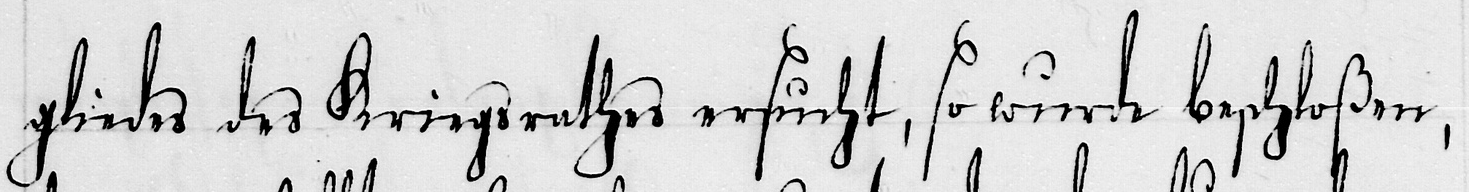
gliedes des Kriegsrathes ersucht, so wurde beschloßen,
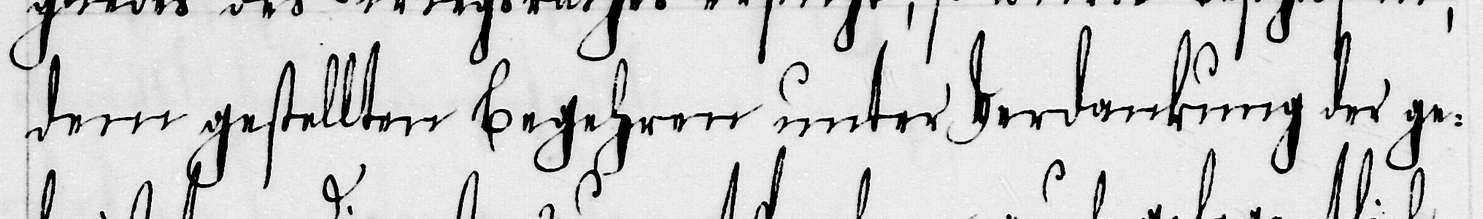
dem gestellten Begehren unter Verdankung der ge¬
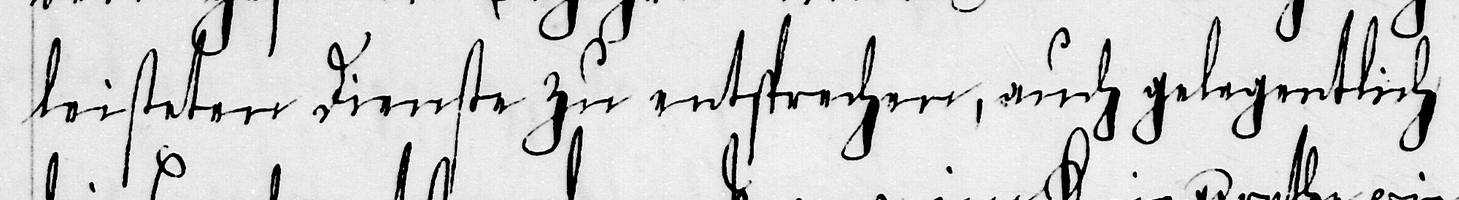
leisteten Dienste zu entsprechen, auch gelegentlich
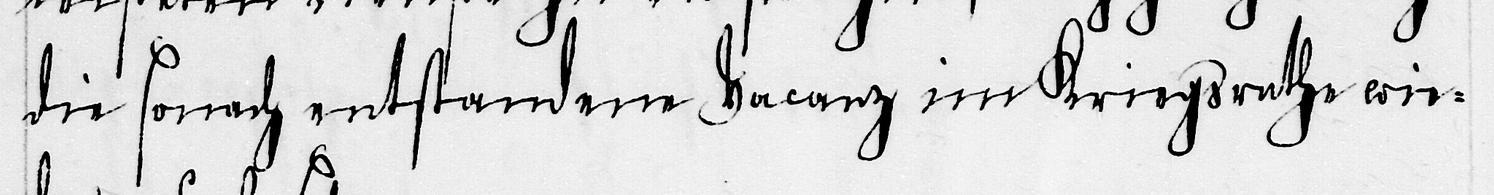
die sonach entstandene Vacanz im Kriegsrathe wie¬
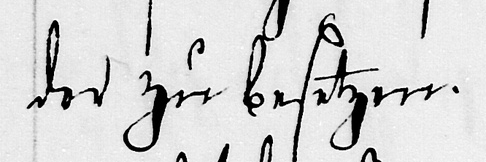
der zu besetzen.
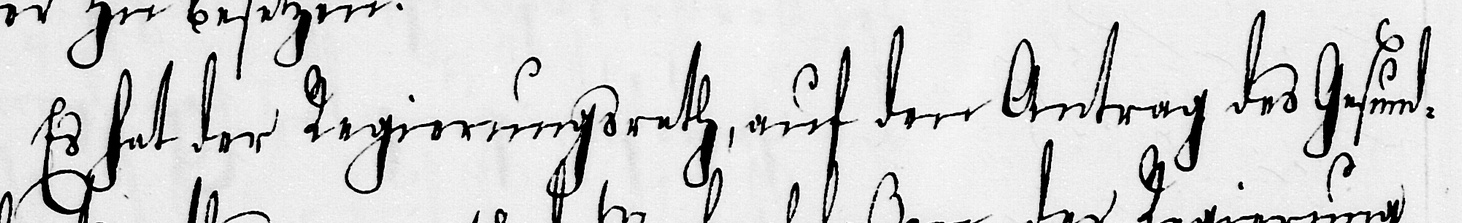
Es hat der Regierungsrath, auf den Antrag des Gesun¬
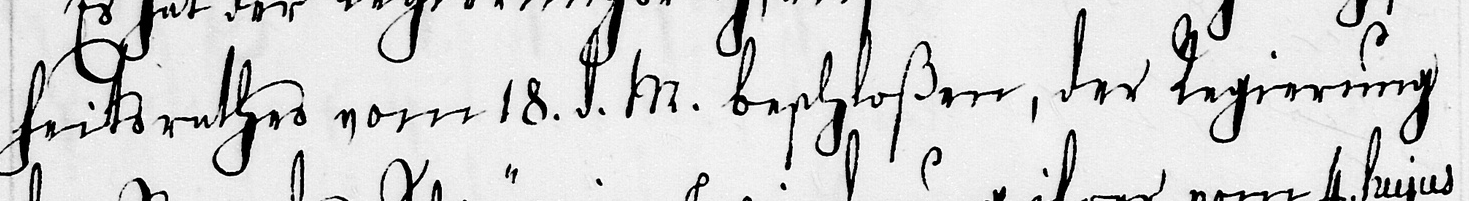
dheitsrathes vom 18. d. M. beschloßen, der Regierung
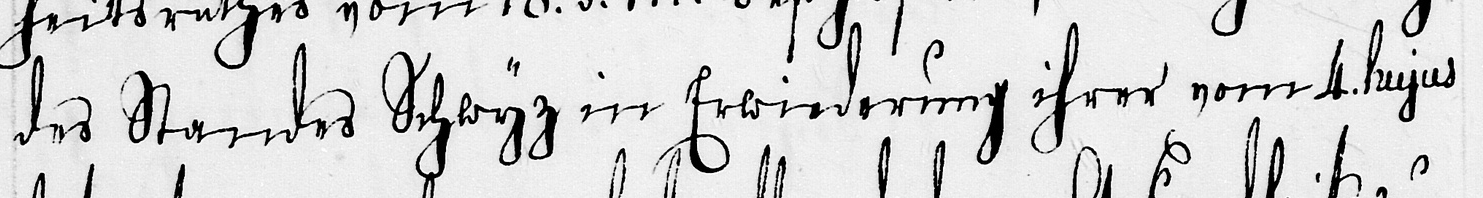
des Standes Schwyz in Erwiederung ihrer vom 4. hujus
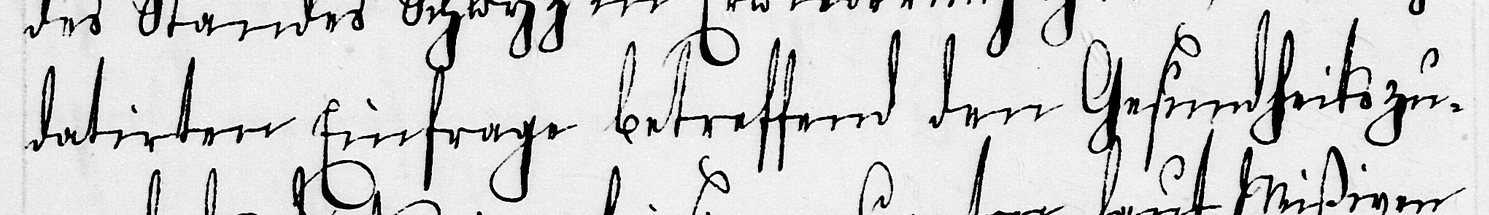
datirten Einfrage betreffend den Gesundheitszu¬
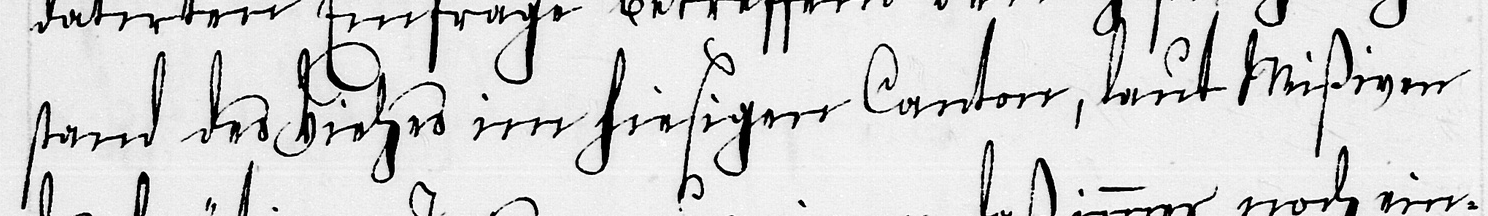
stand des Viehes im hiesigen Canton, laut Mißiven
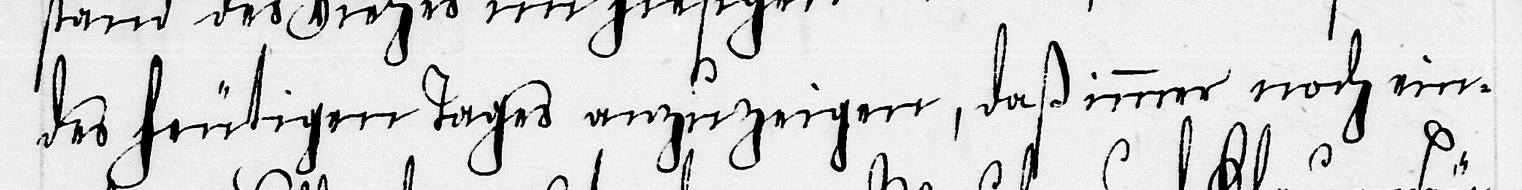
des heutigen Tages anzuzeigen, daß immer noch ein¬
